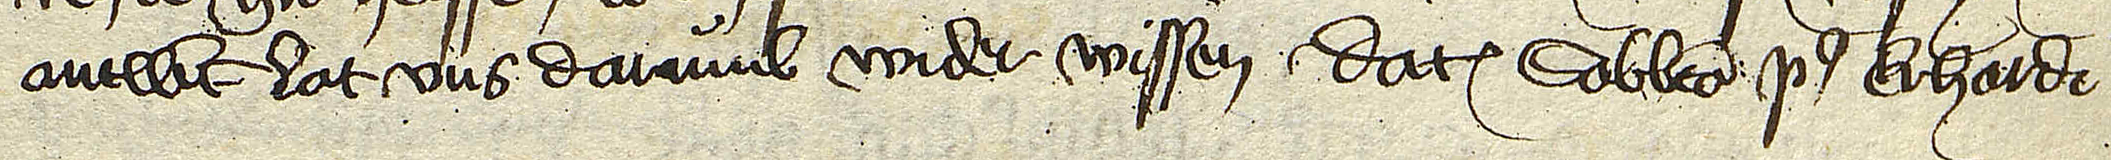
antw*t lat vns darümb wider wiſſen / dat* Sabbto* p* Erhardi
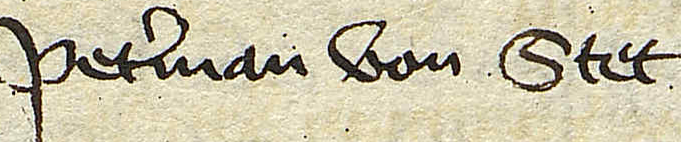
Pet*man von Stet
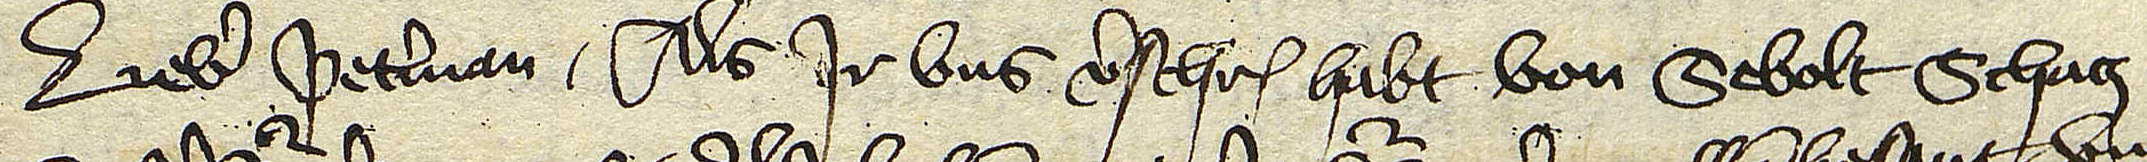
Lieb* Pet*man / Als Ir vns v*ſchr* habt von Sebolt Schucʒ
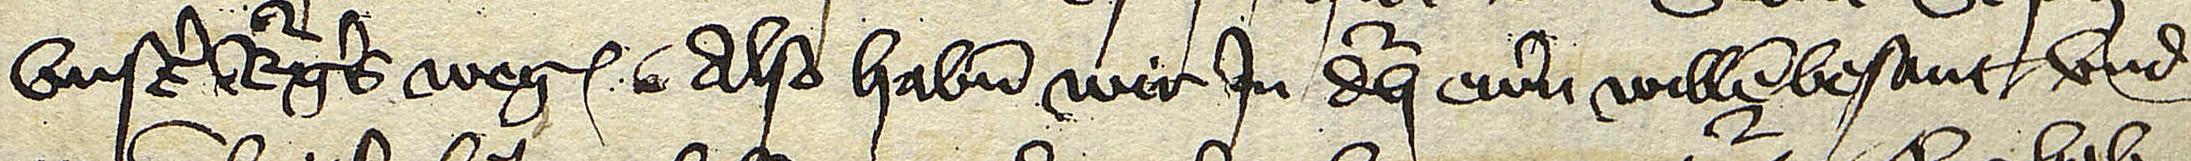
vnſs* B*g*s weg* / Alſo habn* wir In d*h ew*n wille* beſant / vnd
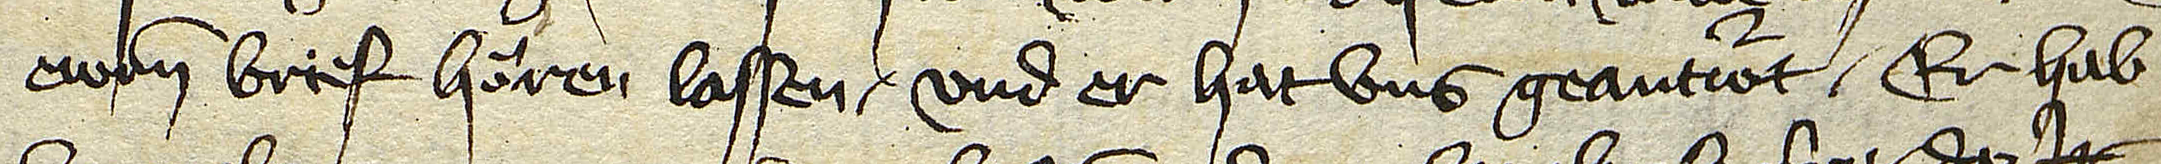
ewr*n brief hören laſſen / vnd er hat vns geantwt* / Er hab
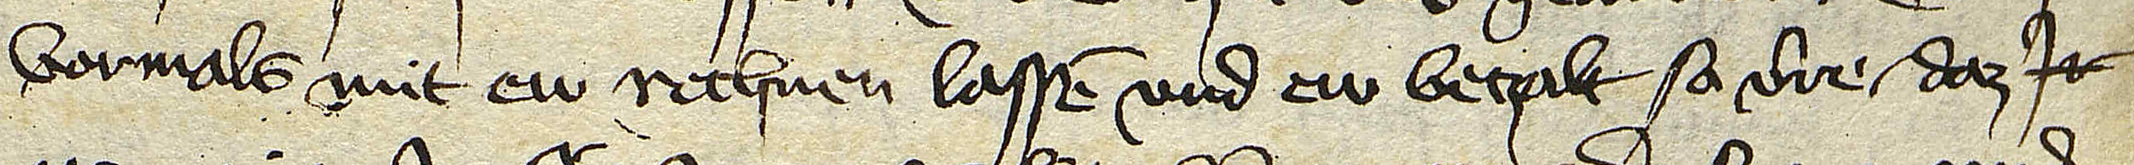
vormals mit ew rechnen laſſe* vnd ew becʒalt ſo v*re / daʒ Ir
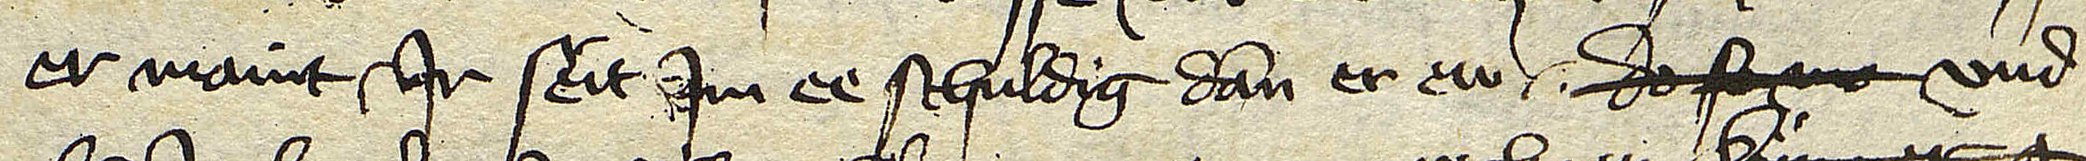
er maint / Ir ſeit Im ee ſchuldig dan* er ew / . do ſo me vnd
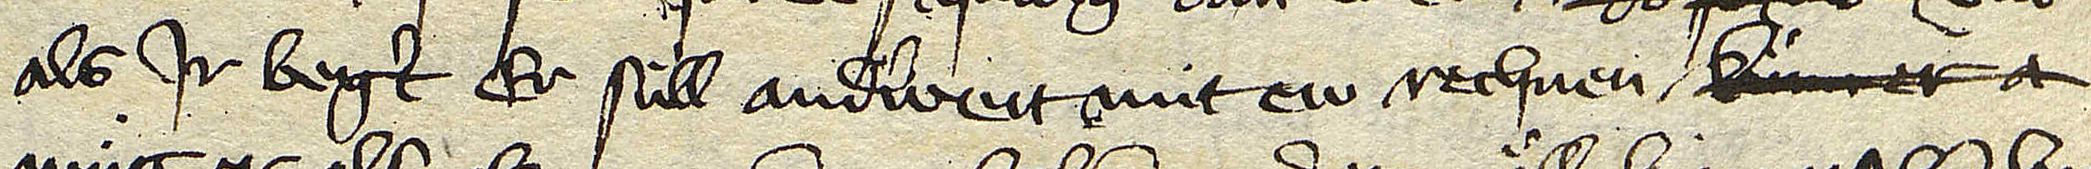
als Ir beg*t Er ſüll and*weit mit ew rechnen / künn er a
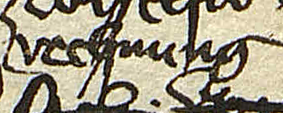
rechnung
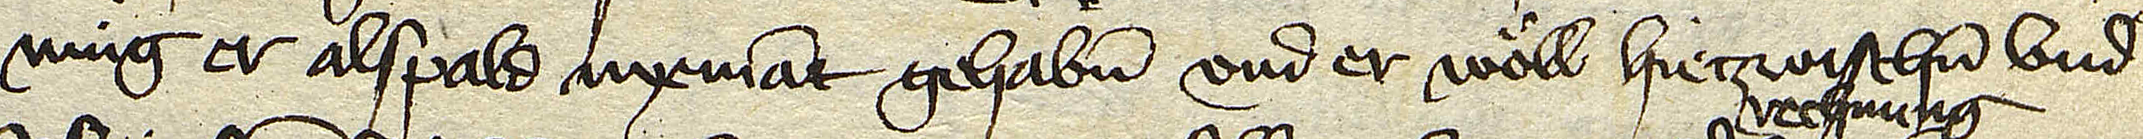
müg er alſpals nyemat* gehabn* vnd er wöll hiecʒwiſchn* vnd
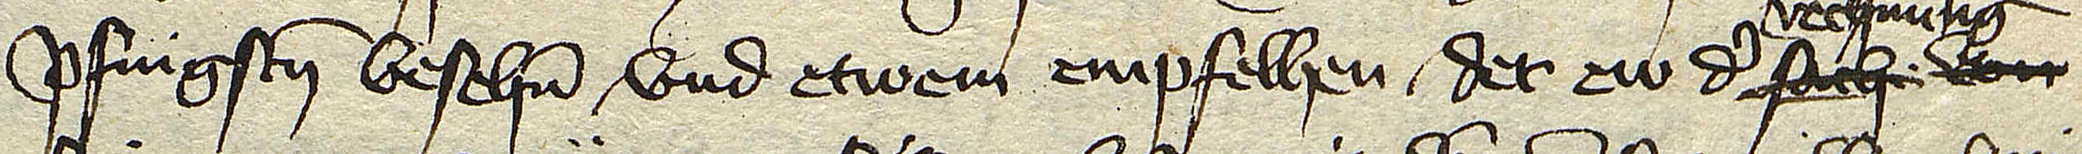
Pfingſtn* beſehn* / vnd etwem empfelhen / der ew d* ſache von
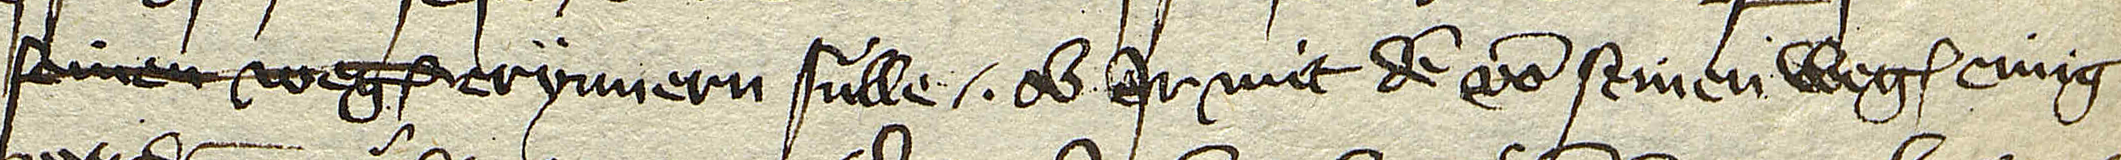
ſeinen weg* erynnern ſülle / . ob Ir mit d* vo* ſeinen weg* einig
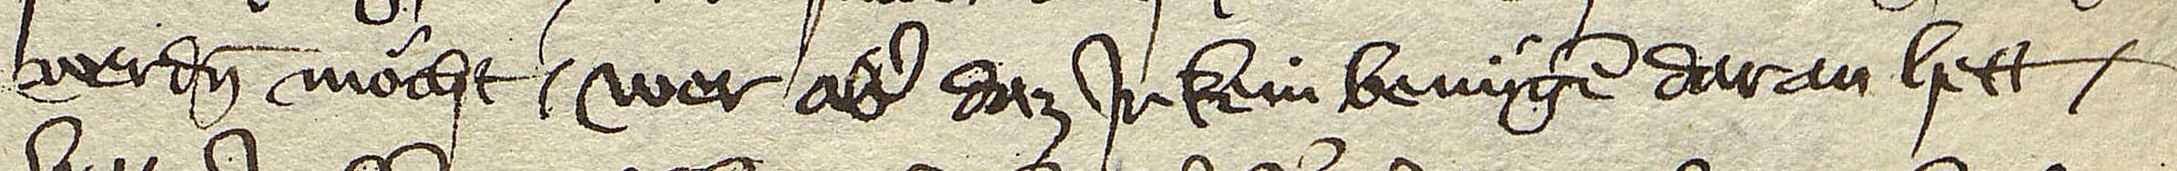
werdn* möcht / wer ab* daʒ Ir kein benüge* daran hett /
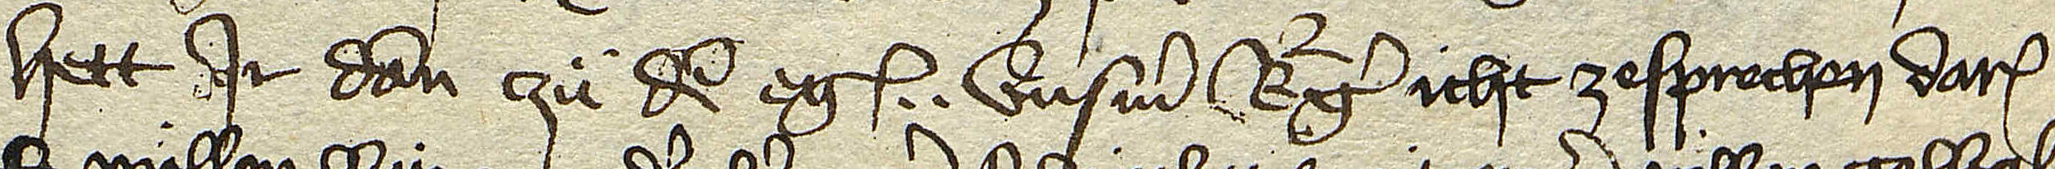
hett Ir dan* cʒü d* eg* ~ vnſm* B*g* icht cʒeſprechen dar*
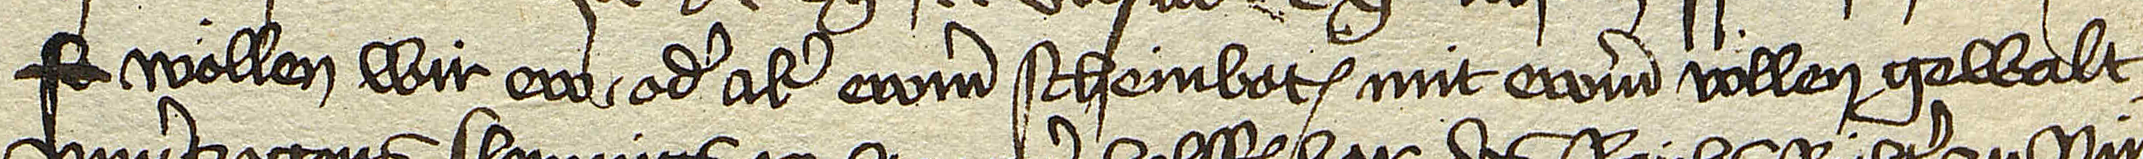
ſo wöllen wir ew / od* ab* ewm* ſcheinbot* mit ewm* vollen gewalt
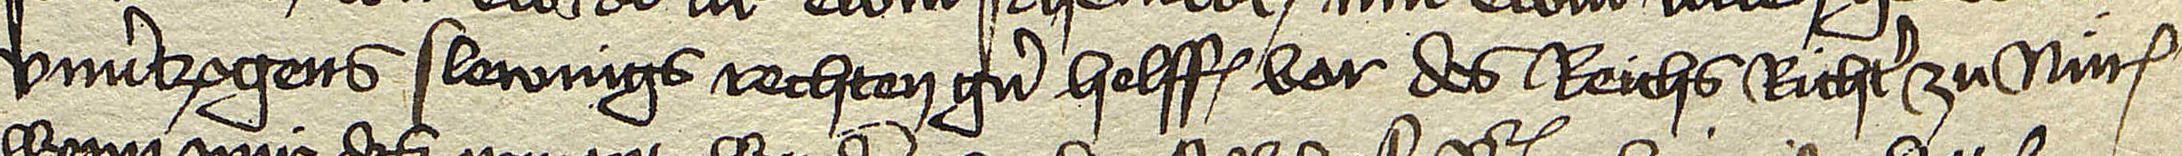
vnu*cʒogens ſlewnigs rechten gn* helff* vor des Reichs Richt* cʒu Nür*
